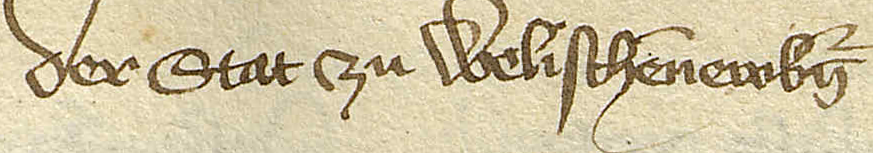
Der Stat cʒu Weliſche*newb*g
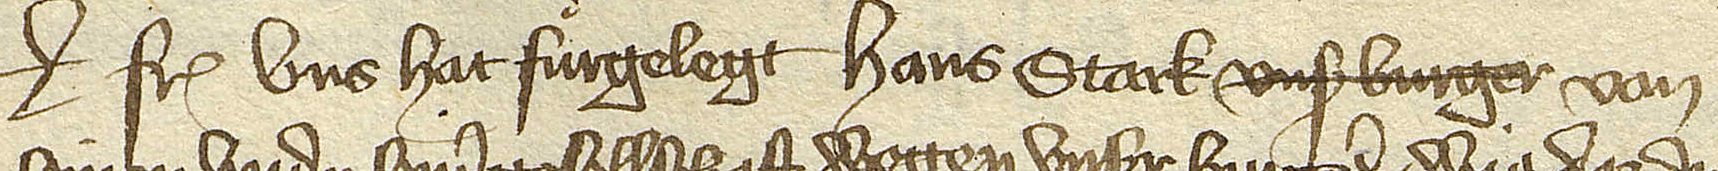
L* fr* vns hat fürgelegt hans Stark vnſ* burger von
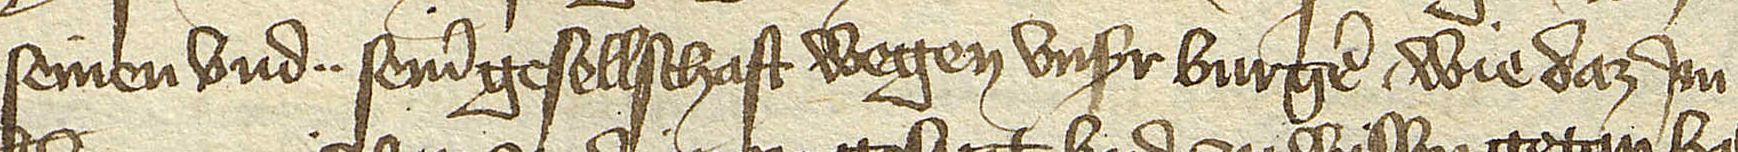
ſeinen vnd ~ ſein* geſellſchaft wegen vnſ*r burge* / wie daʒ Im
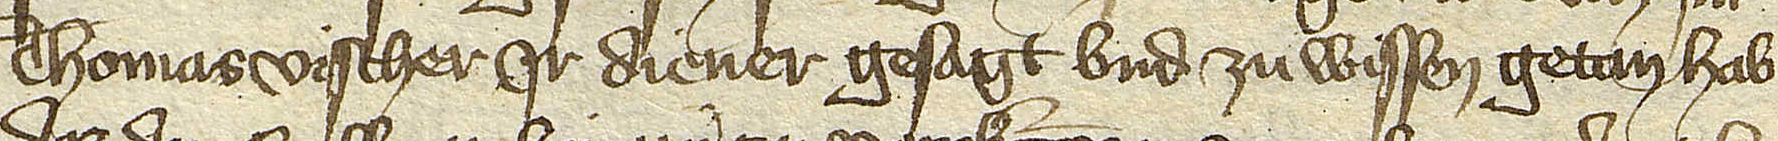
Thomas viſcher Ir diener geſagt vnd cʒu wiſſen getan hab
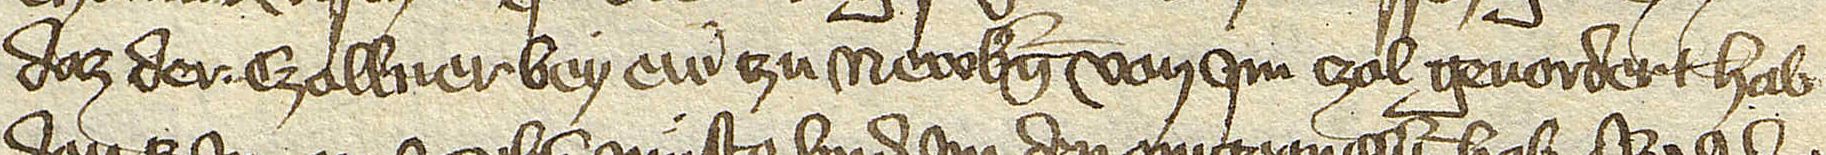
daʒ der Cʒollner bey ew* cʒu Newb*g von Im cʒol geuordert hab
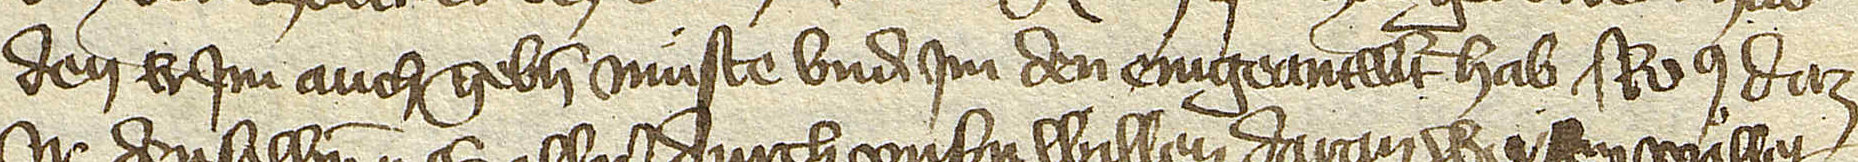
den Er Im auch gebn* müſte vnd Im den eingeantw*t hab / Ro* daʒ
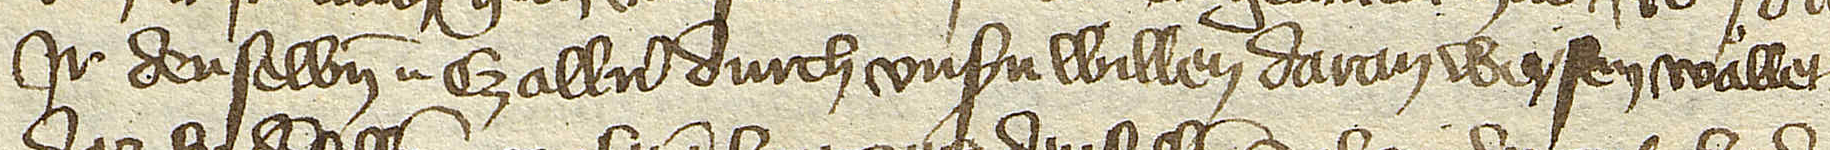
Ir denſelbn* ~ Cʒolln* durch vnſ*n willen daran weiſen wöllet
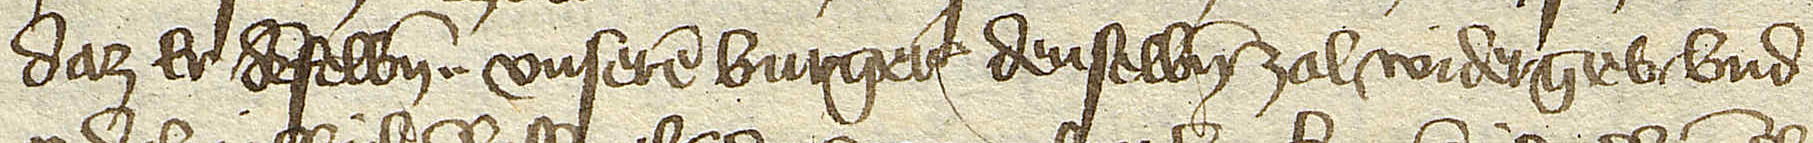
daʒ Er de*ſelbn* ~ vnſere* burger* denſelbn* cʒol widergeb / vnd
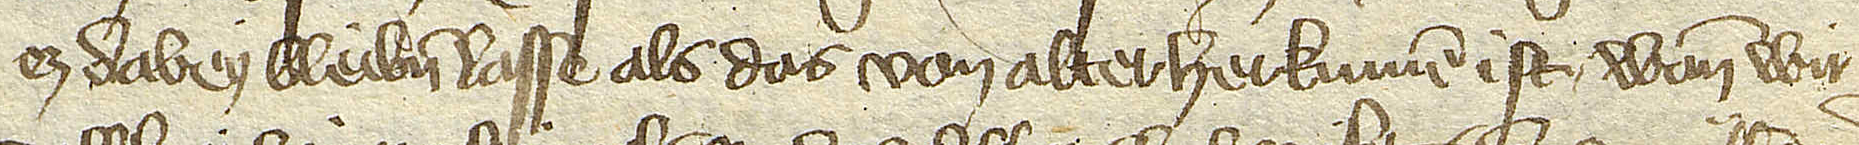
eʒ dabey bleibn* laſſe als das von alterherkume* iſt / wan* wir
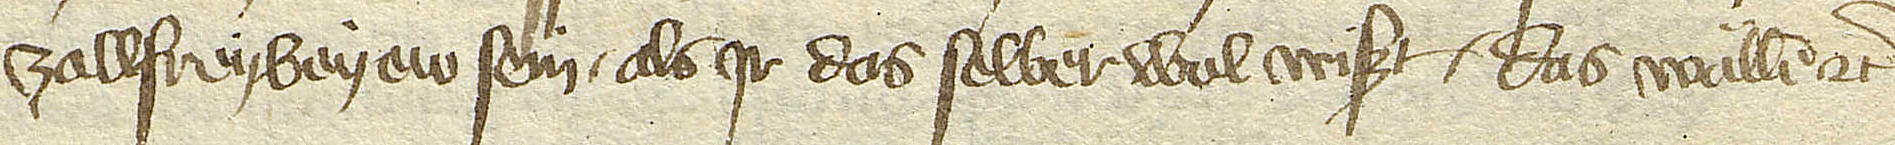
cʒollfrey bey ew ſein / als Ir das ſelber wol wiſʒt / Das wölle* ec*
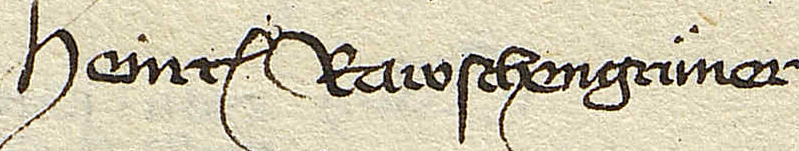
heinr* Rawſchengrüner
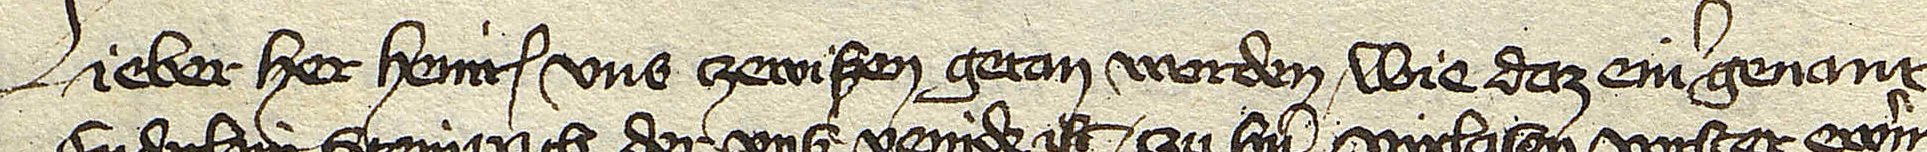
Lieber her heinr* vns cʒewiſʒen getan worden / wie daʒ ein* genant
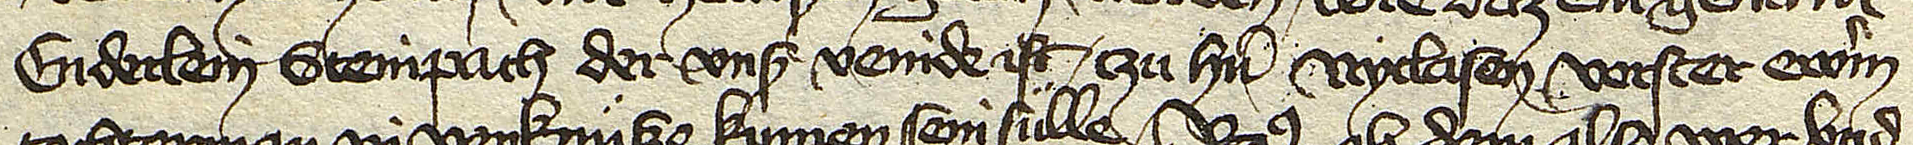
Enderlein Steinpach der vnſ* veinde iſt / cʒu hn* Nyclasen vorſter ew*m
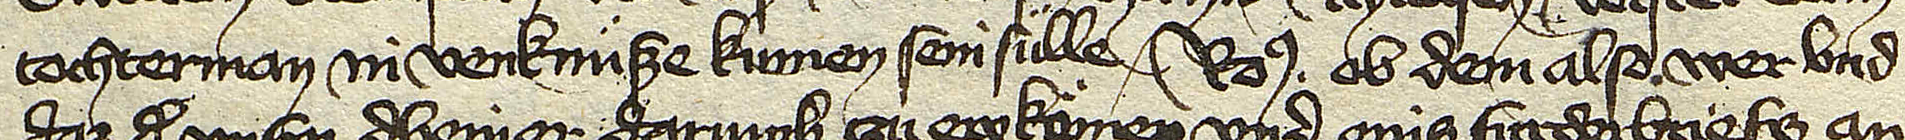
tochterman in venknüſʒe kumen ſein ſülle / Ro* . ob dem alſo wer vnd
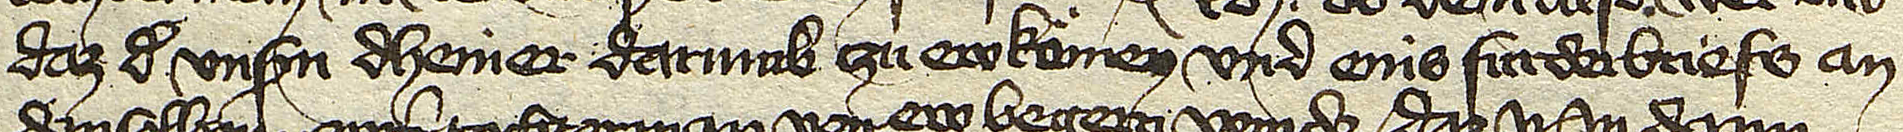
daʒ d* vnſ*n dheiner darumb cʒu ew kömen vnd eins furderbriefs an
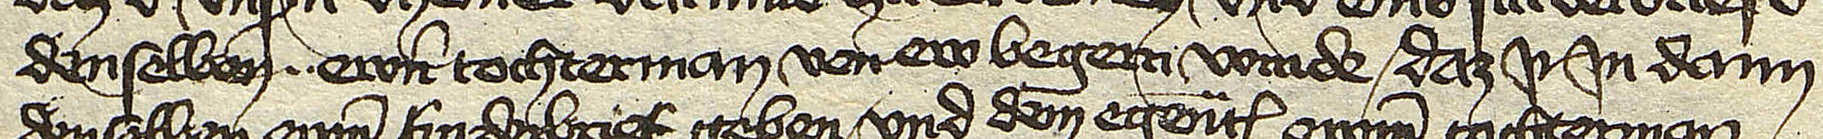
denſelben ~ ewn* tochterman von ew begern wurde / daʒ Ir In dann
